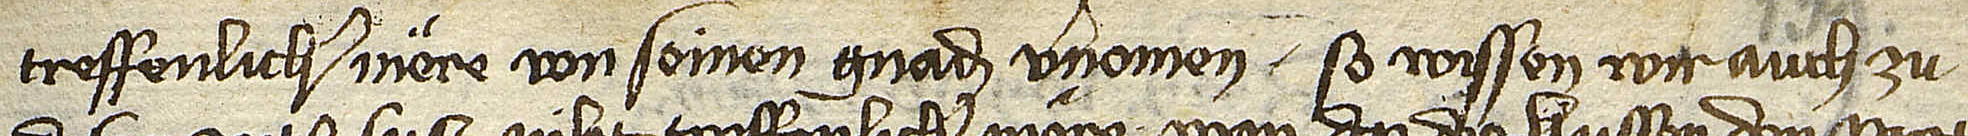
treffenlich* mëre von ſeinen gnad* v*nomen / ſo wiſſen wir auch ʒu
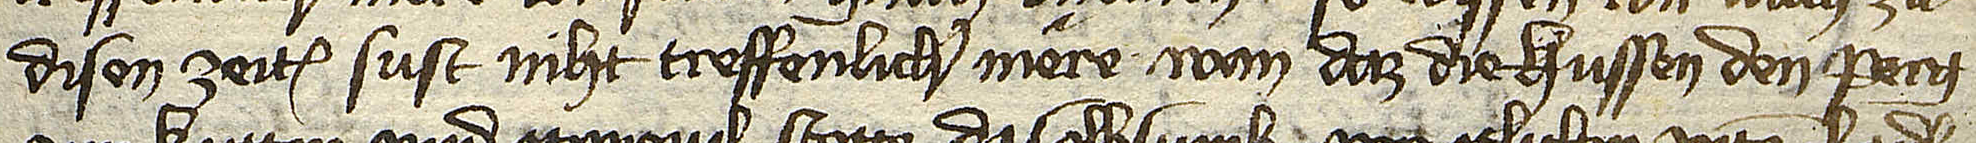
diſen ʒeit* ſuſt niht treffenlich* mëre . wan daʒ die Huſſen den Perg
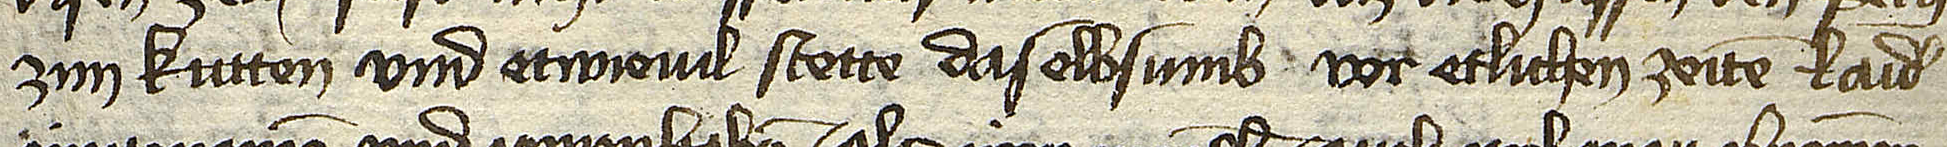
ʒum Kutten vnd etwieuil ſtette daſelbſumb vor etlichen ʒeite* laid*
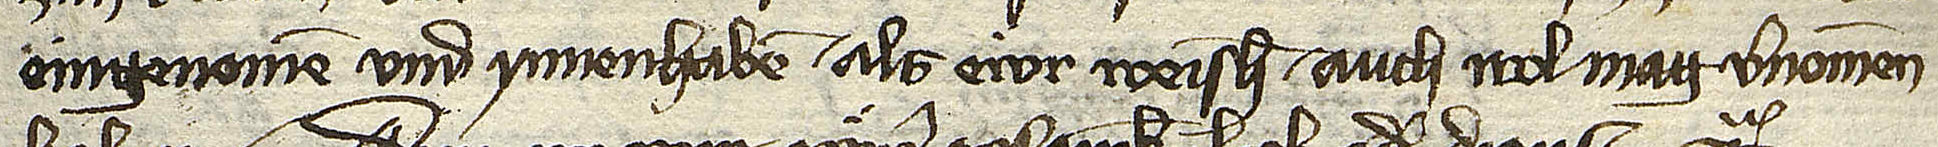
eingenome* vnd ynnenhabe* / als eẅr weiſh* / auch wol mag v*nom*en
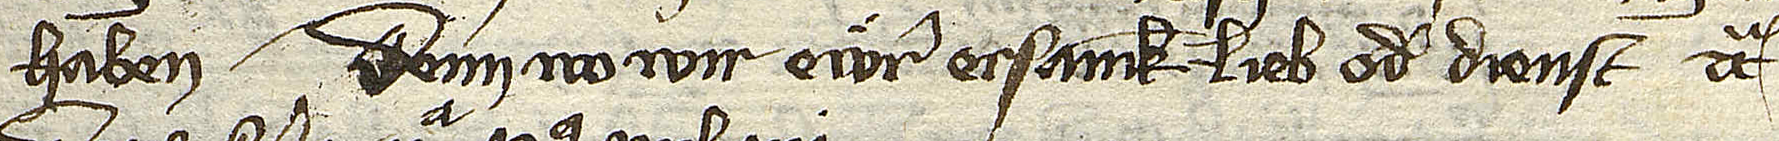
haben / Denn wo wir eẅr erſamk* lieb od* dienſt ec*
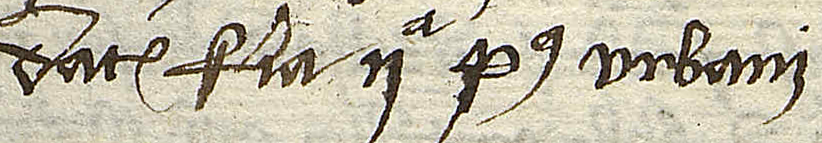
Dat* fia* ii* p* Vrbani
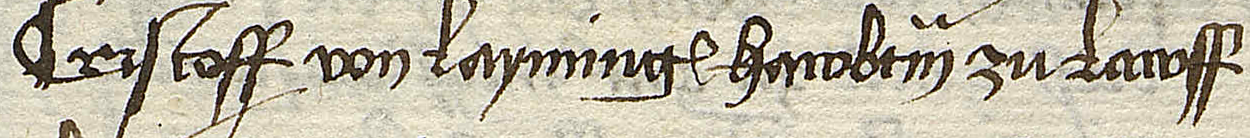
Criſtoff von layming* hawbtm* ʒu Lawff
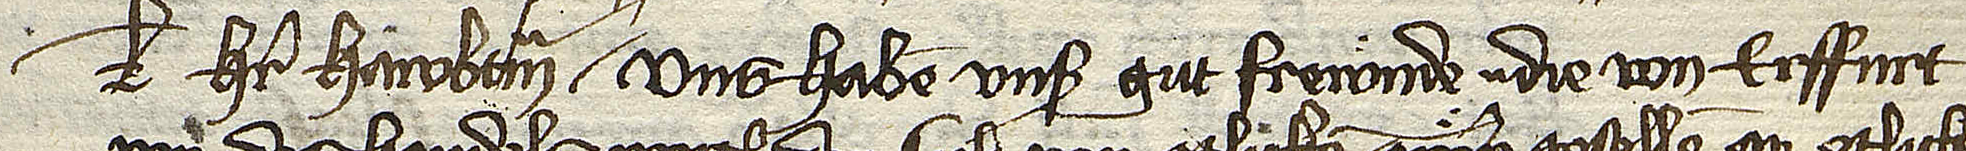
L* h*r hawbtm* / Vns habe* vnſ* gut freẅnde ~ die von Erffurt
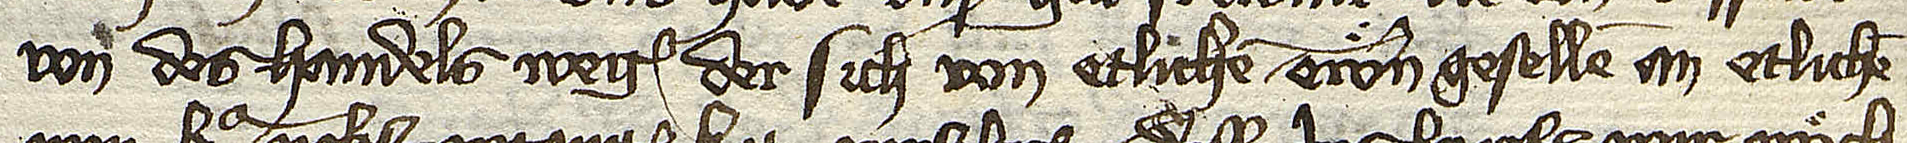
von des handels weg* der ſich von etliche* / eẅ*n geſelle* an etliche*
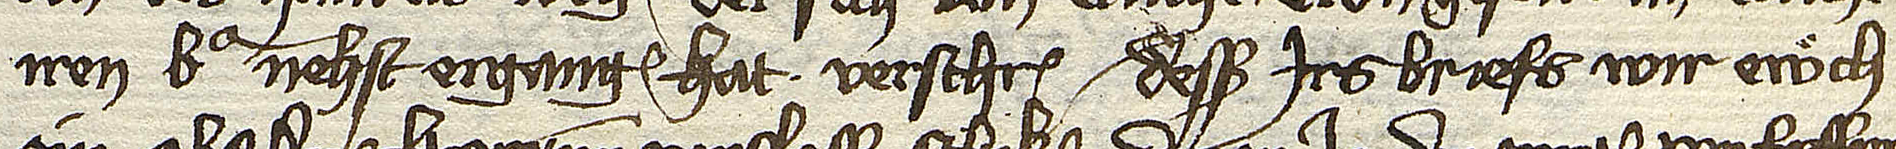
iren b* nehſt ergang* hat . verſchr* / deſſ* Irs briefs wir eẅch
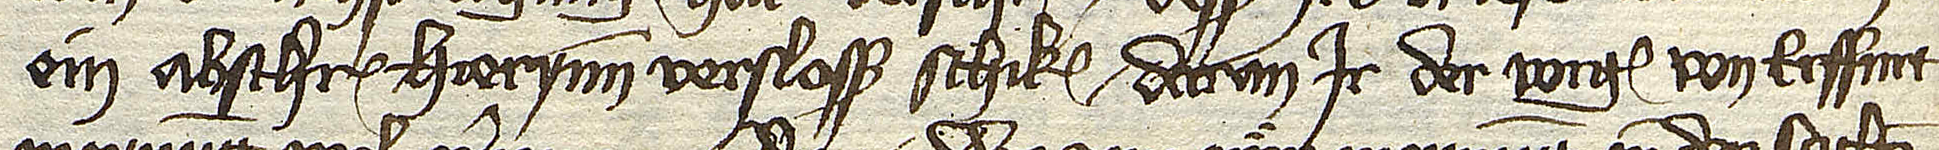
ein abſchr* hierynn* verſloſſ* ſchik* / daran Ir der vorg* von Erffurt
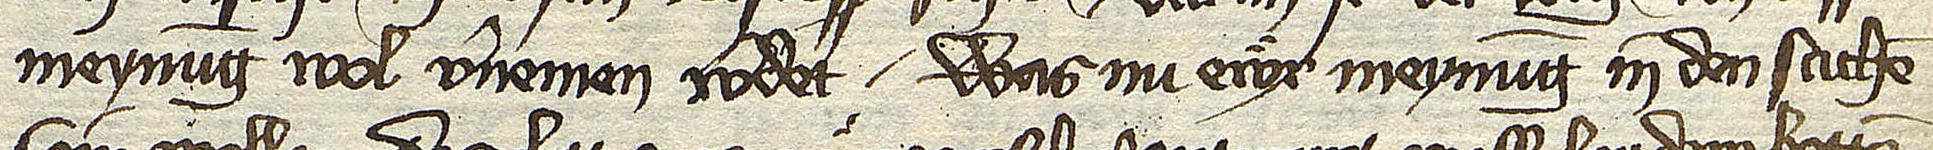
meynug* wol v*nemen w*det / Was nu eẅr meynu*g in den ſache*
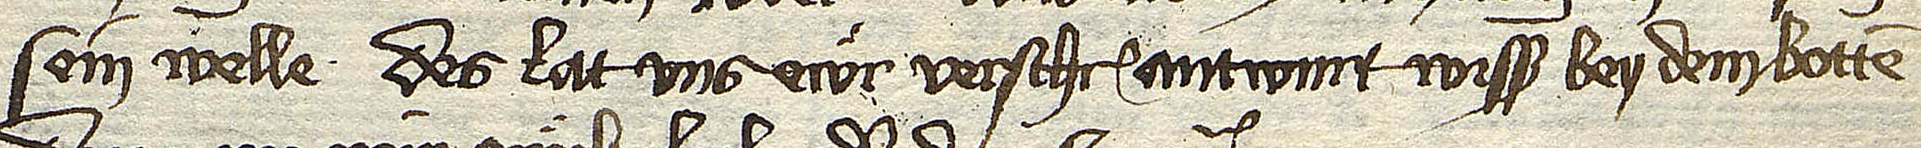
ſein welle . Des lat vns eẅr verſchr* antwurt wiſſ* bey dem botte*
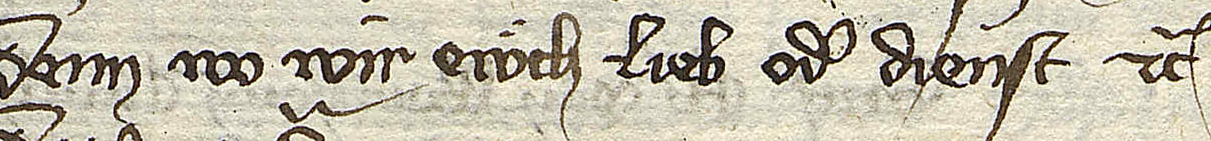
Denn wo wir eẅch lieb od* dienſt ec*
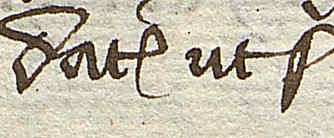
Dat* ut ſ*
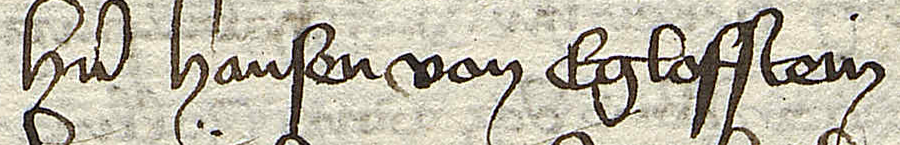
hn* Hanſen von Eglofſtein
